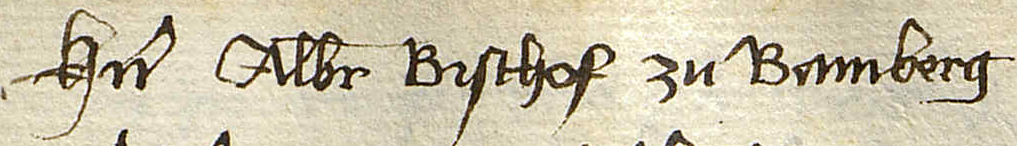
Hn* Albr* Biſchof ʒu Bamberg
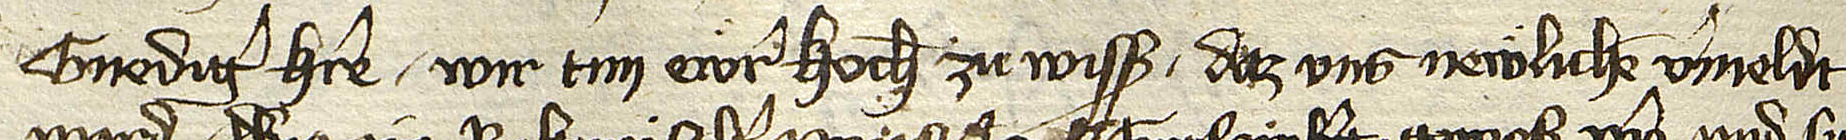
Gnedig* hr*e / wir tun eẅr* hoch* ʒu wiſſ* / daʒ vnd neẅliche v*meldt
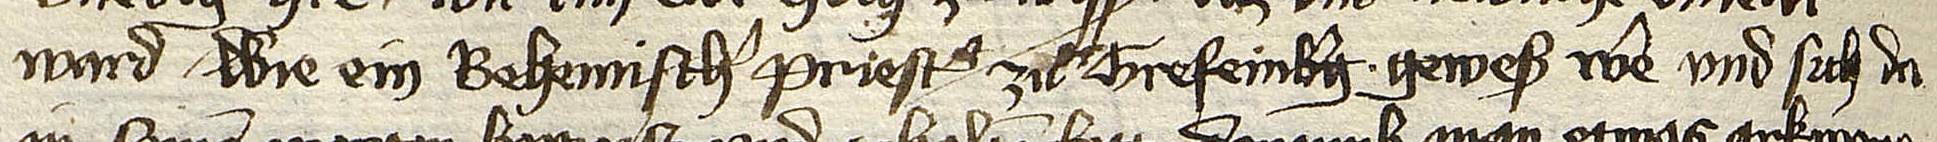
ward / wie ein Behemiſch* Prieſt* ʒu Grefemb*g geweſ* w*e vnd ſich da
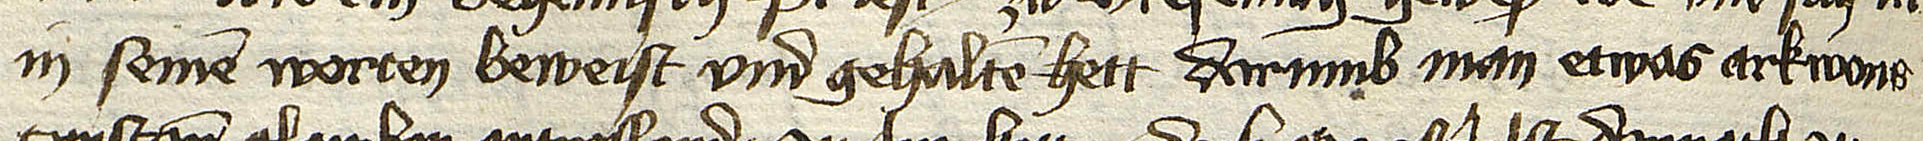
in ſeine* worten beweiſt vnd gehalte* hett darumb man etwas arkwons
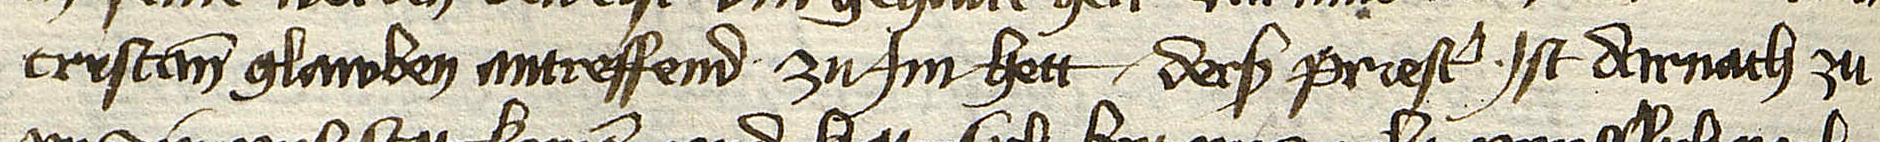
criſtan* glawben antreffend ʒu Im hett / derſ* Prieſt* . Iſt darnach ʒu
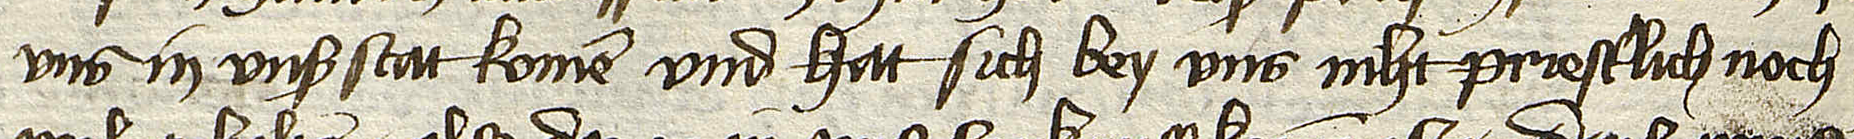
vns in vnſ* ſtat kome* vnd hat ſich bey vns niht Prieſt*lich noch
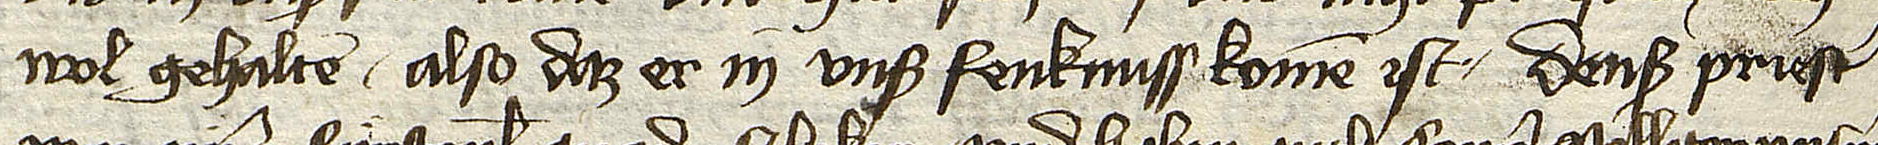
wol gehalte / alſo daʒ er in vnſ* fenknuſſ kome* iſt / Denſ* prieſt*
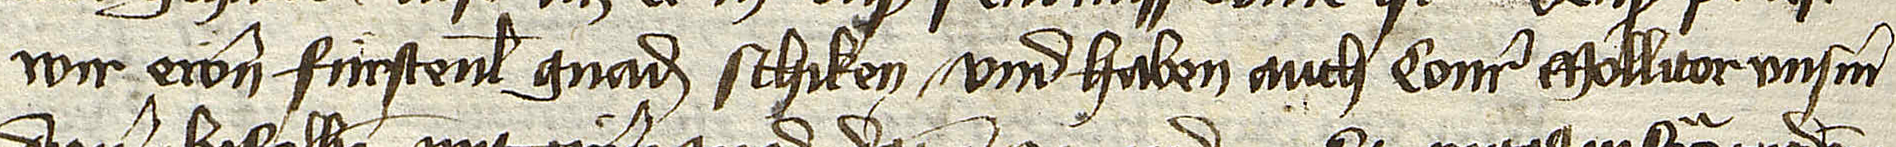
wir ew*n fürſtenl* gnad* ſchicken / vnd haben auch Conr* Mollitor vnſm*
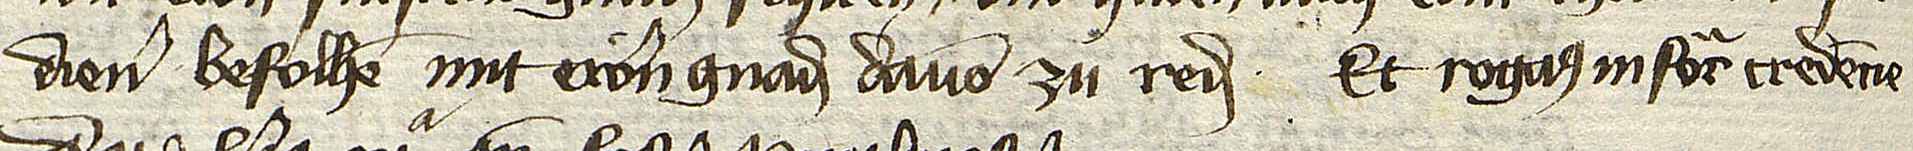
dien* befolhe* mit ew*n gnad* dauo* ʒu red Et roga* in for* credecie*
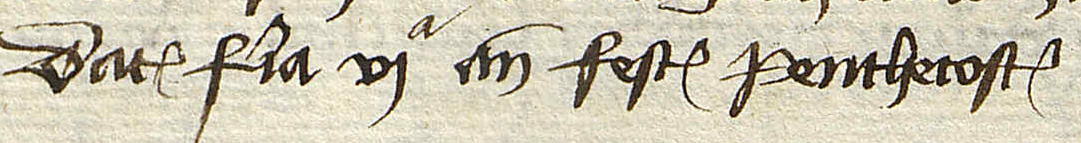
Dat* fia* vi* an* feſt* Penthecoſt*
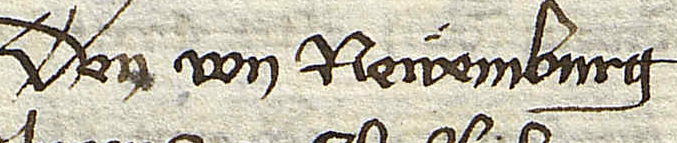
Den von Neẅemburg
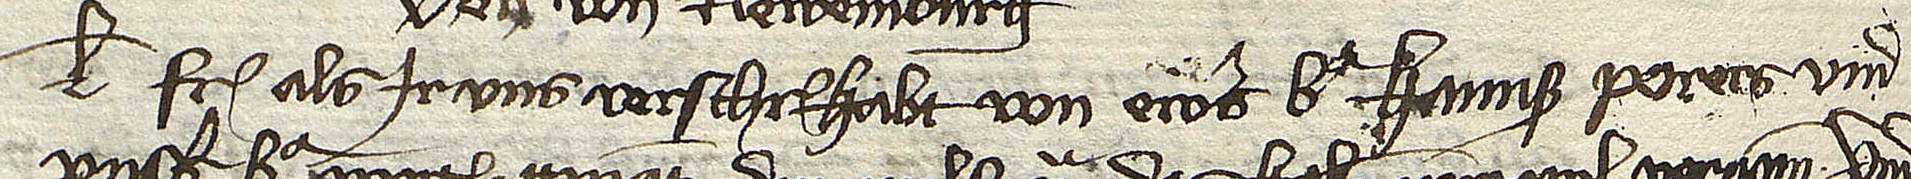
L* fr* als Ir vns verſchr* habt von eẅ*s b* Hannſ* porers vnd
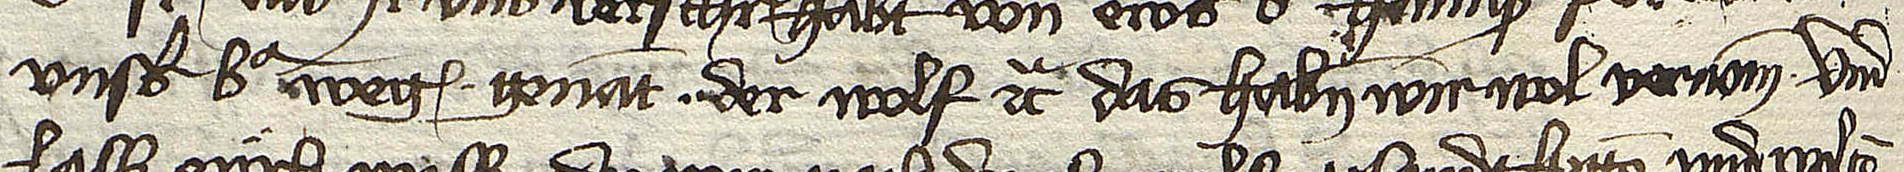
vnſs* B* weg* genat* ~ der wolf ec* das habn* wir wol vernom* . Vnd
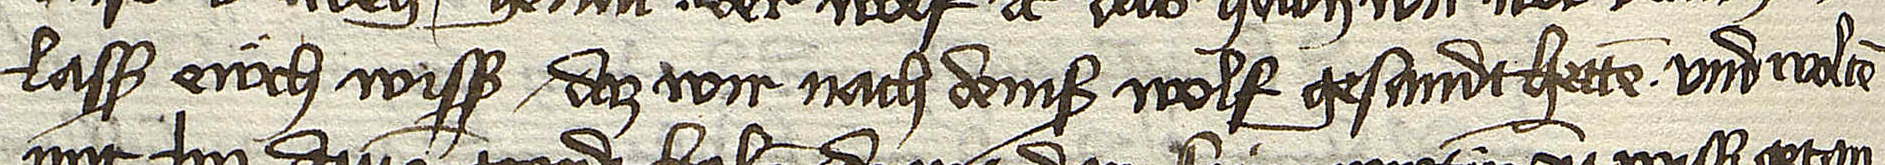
laſſ* eẅch wiſſ* / daʒ wir nach demſ* wolf geſandt hete* vnd wolte*
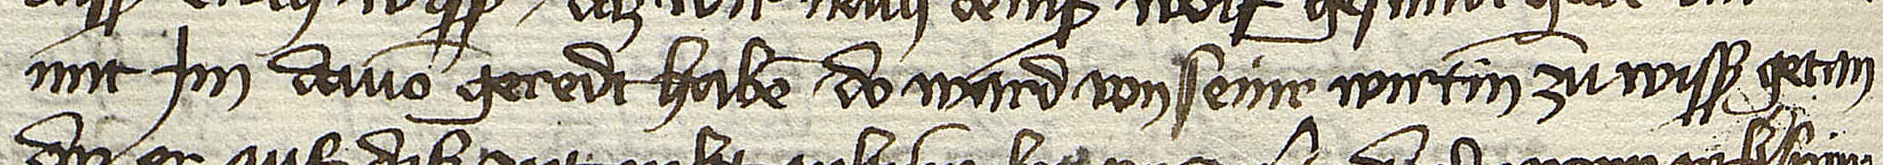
mit Im dauo* geredt habe* / do ward von ſeinr wirtin* ʒu wiſſ* getan
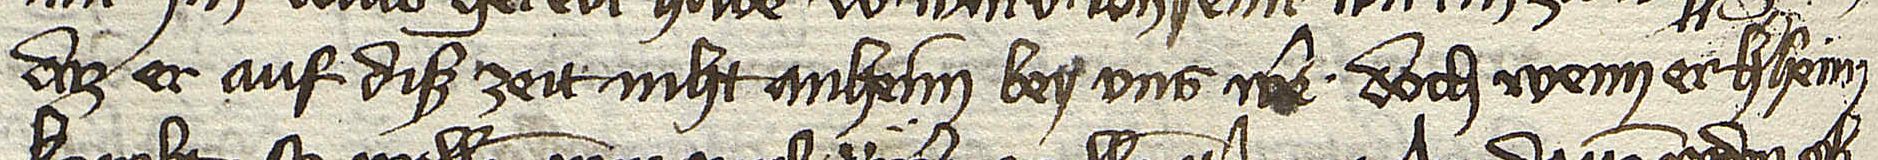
daʒ er auf diſʒ ʒeit niht anheim* bey vnd w*e . Doch wenn er h*heim
